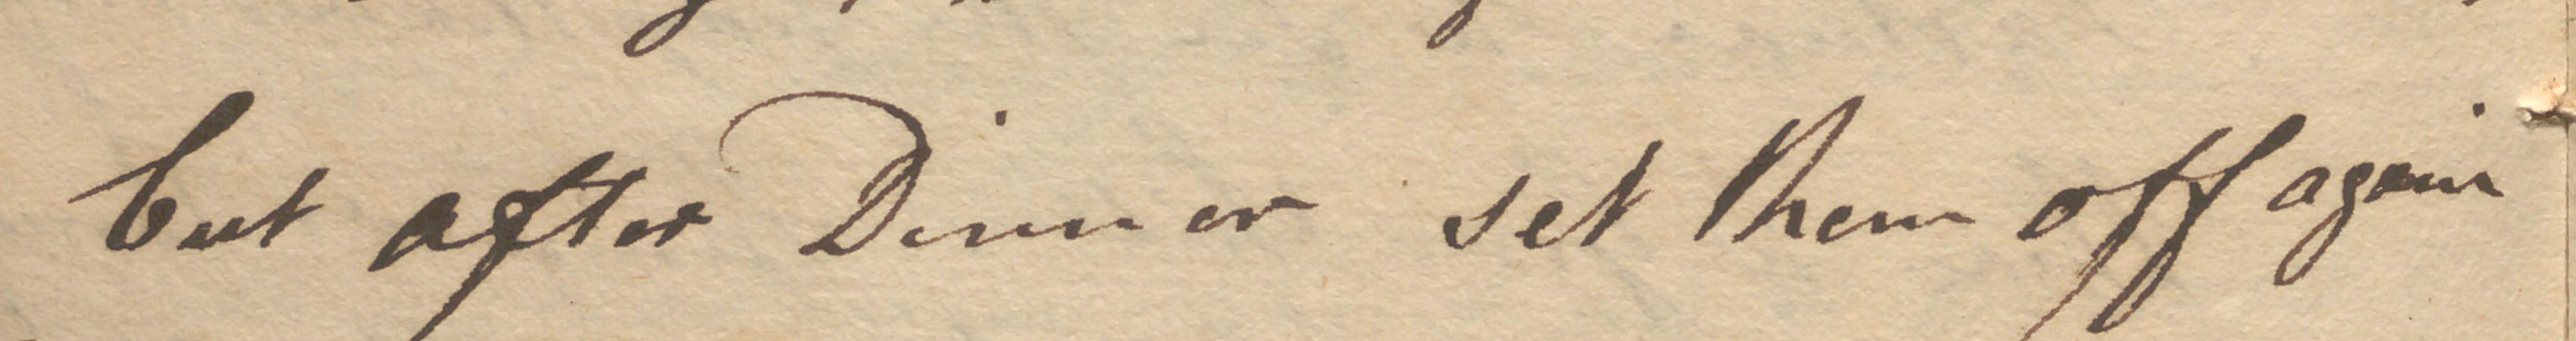but after Dinner set them off again
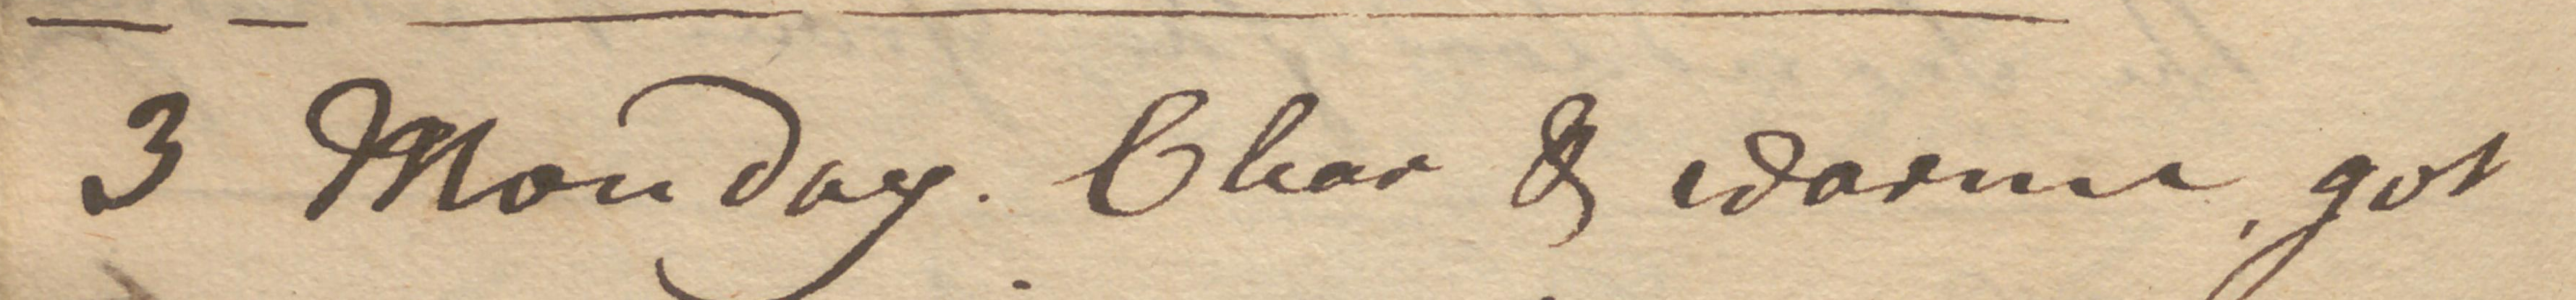3 Monday. Clear & warme, got
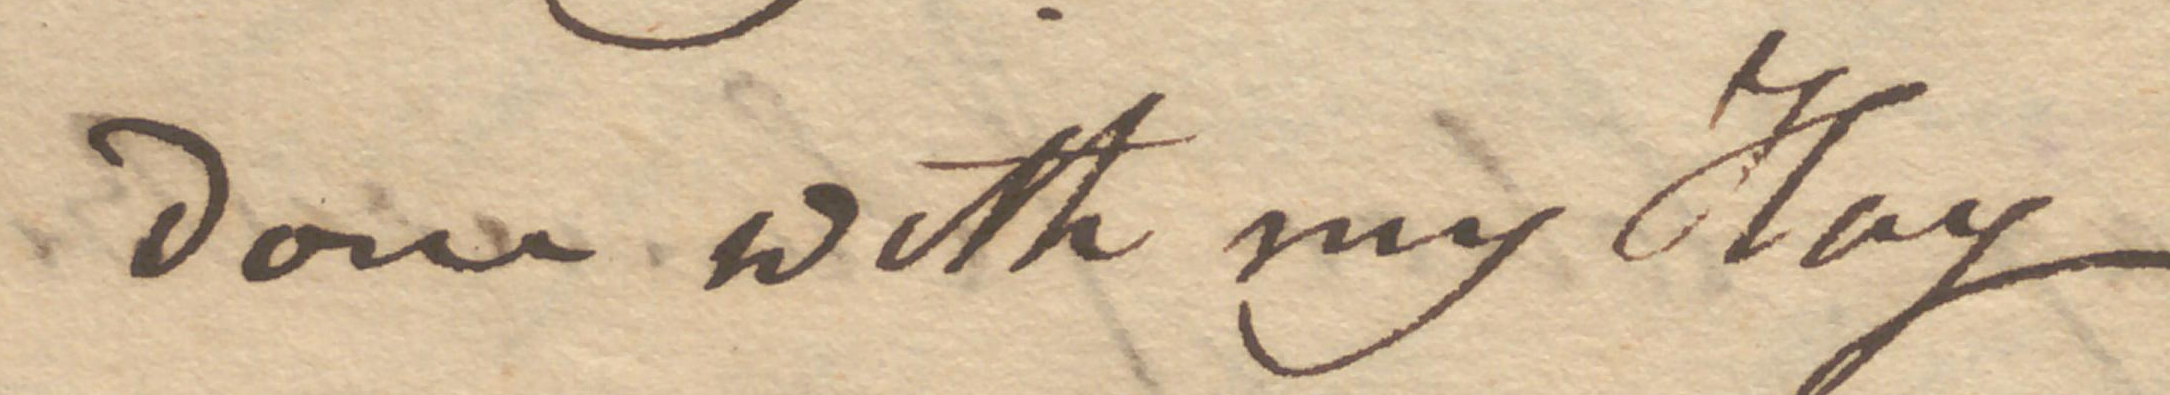done with my Hay
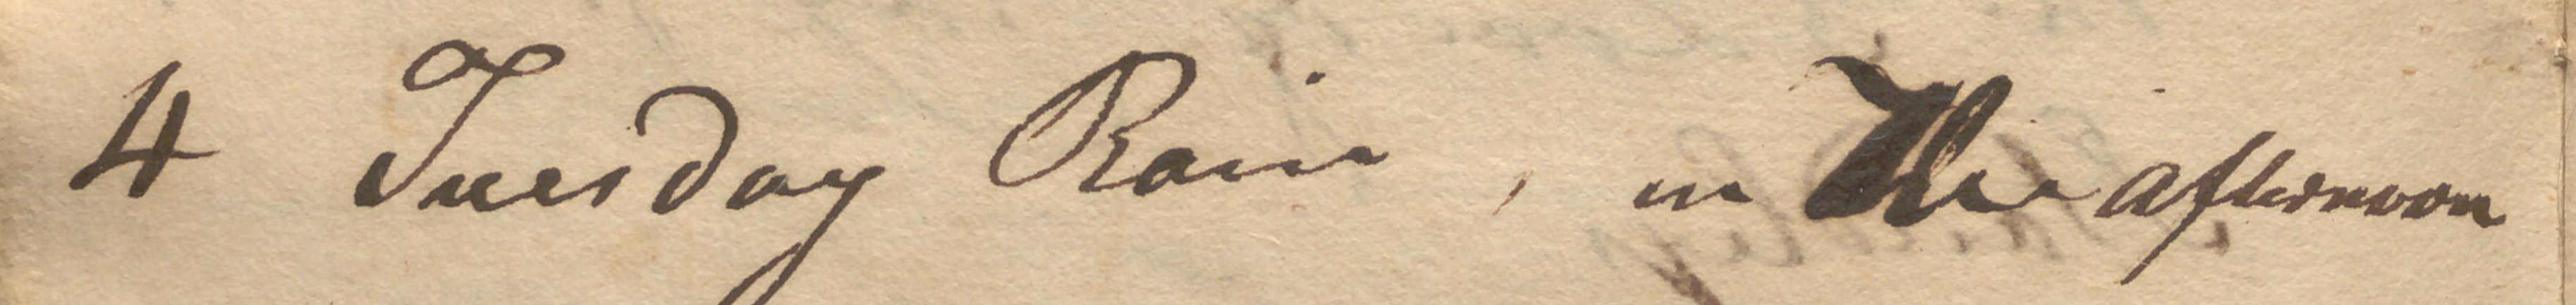4 Tuesday Rain, in the afternoon
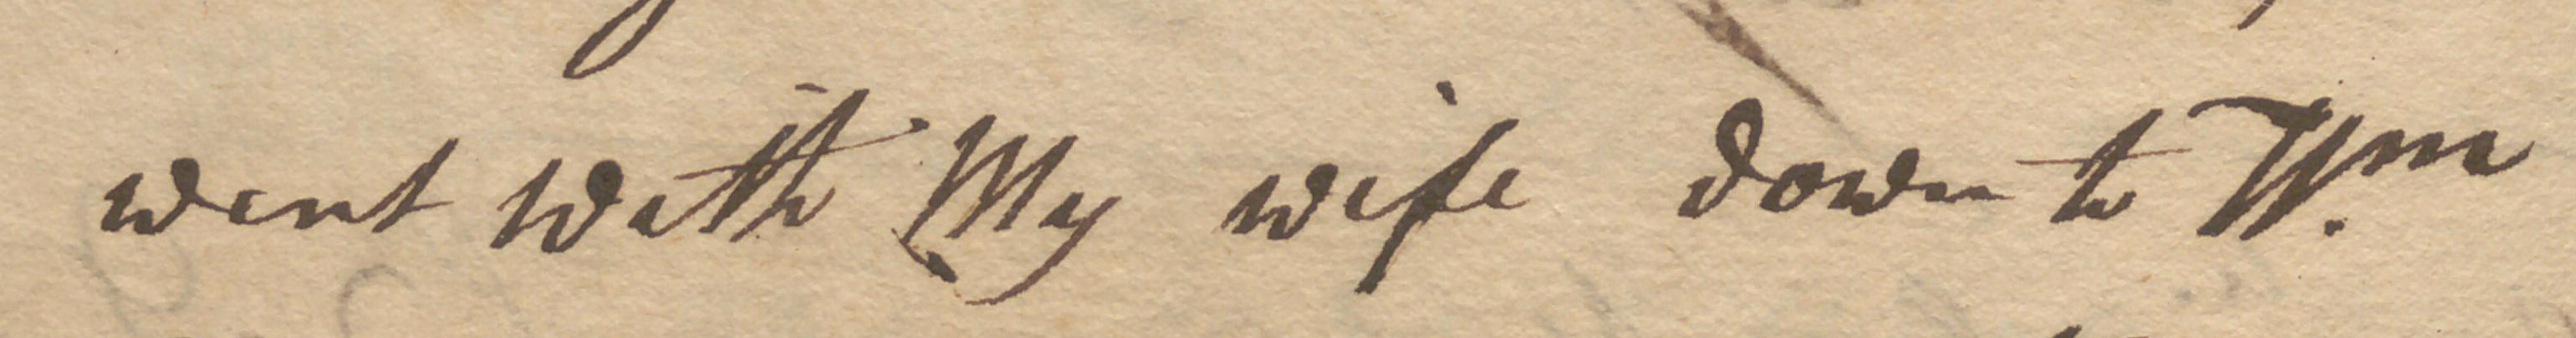went with My wife down to W^m.
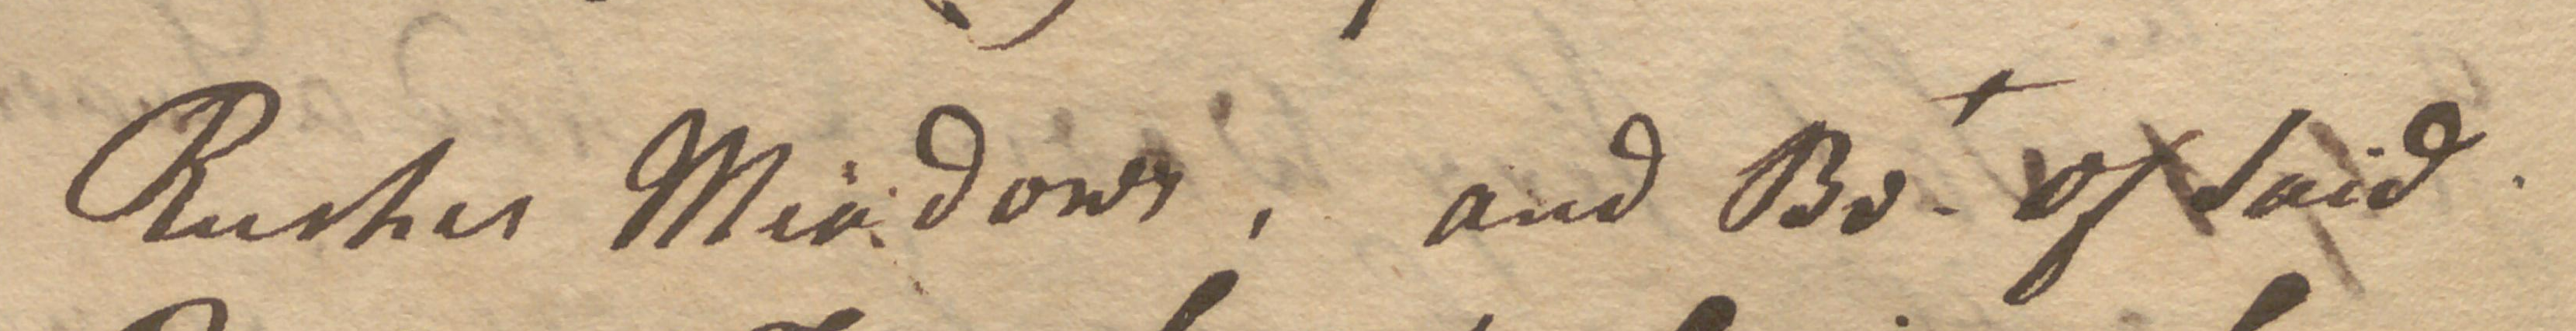Rushes Meadows, and Bo^t. of Said
